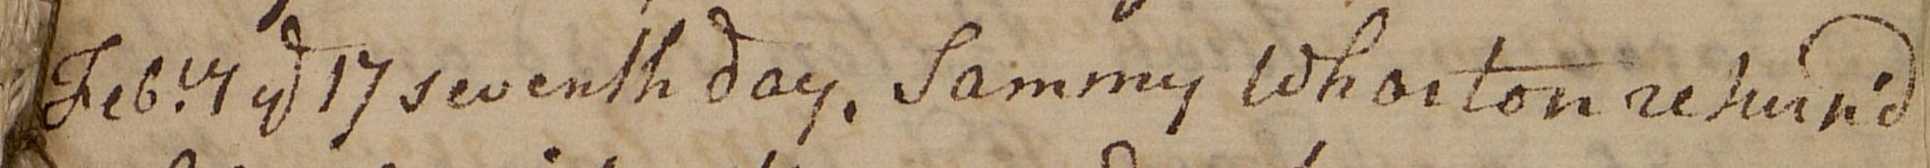Feb^ry y^e 17 seventh day, Sammy Wharton return'd
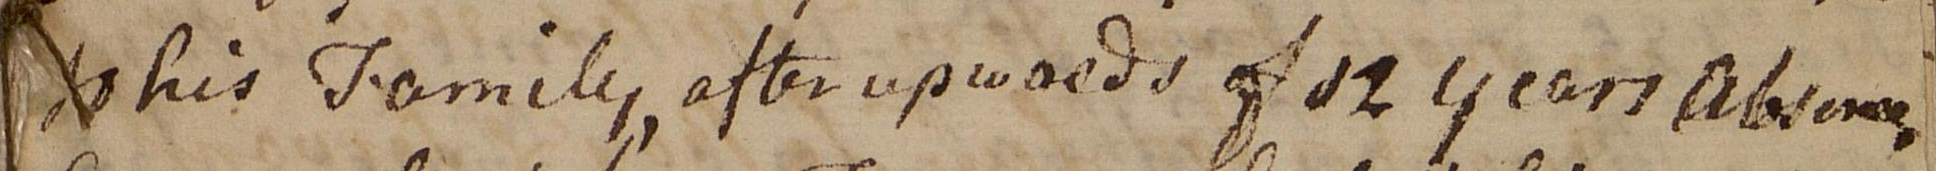to his Family, after upwards of 12 years Absence,
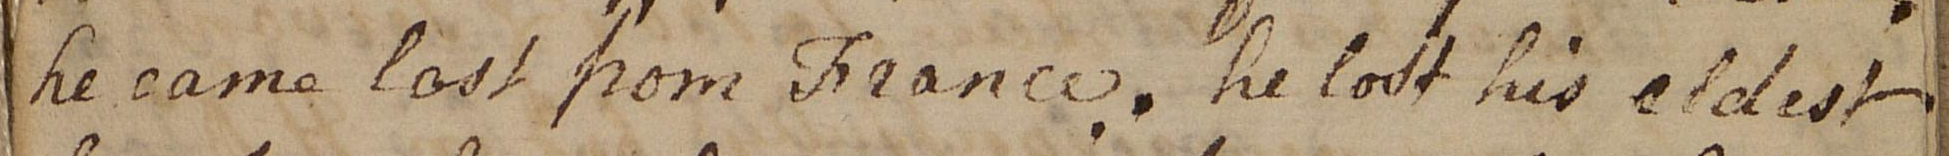he came last from France, he lost his oldest
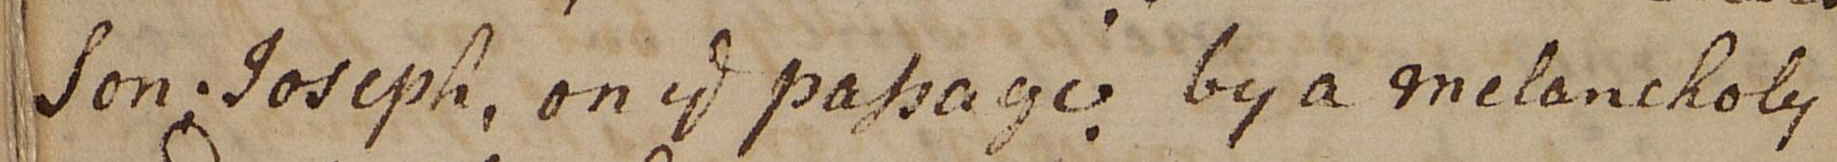Son; Joseph, on y^e passage by a melancholy
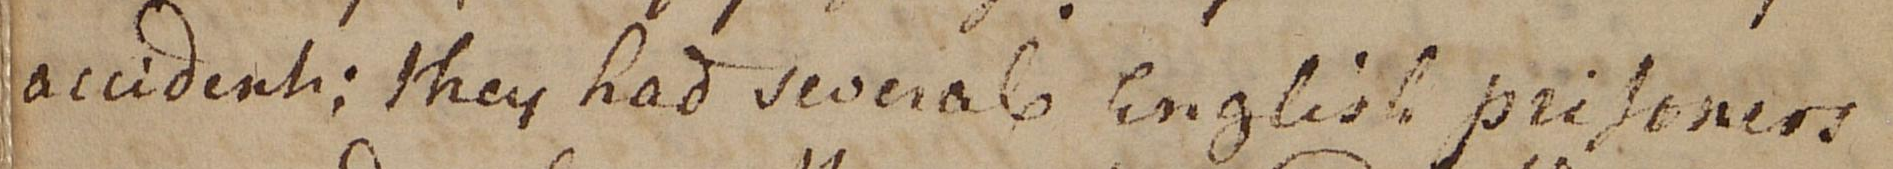accident; they had several English prisoners
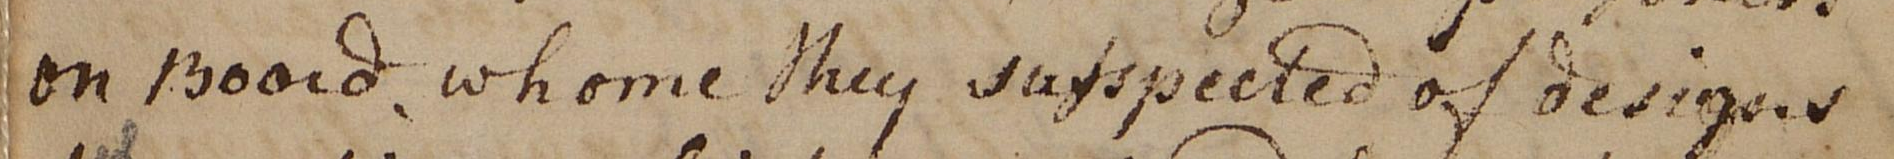on Board, whome they susspected of designs
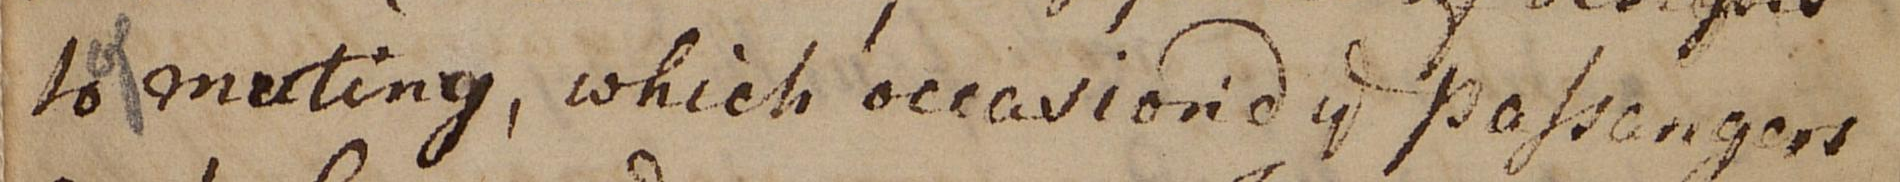to meeting, which occasion'd y^e passengers
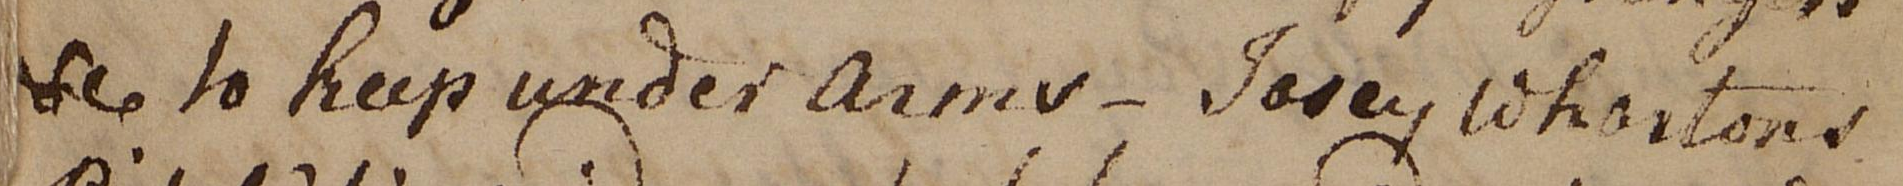&c to keep under Arms- Josey Whartons
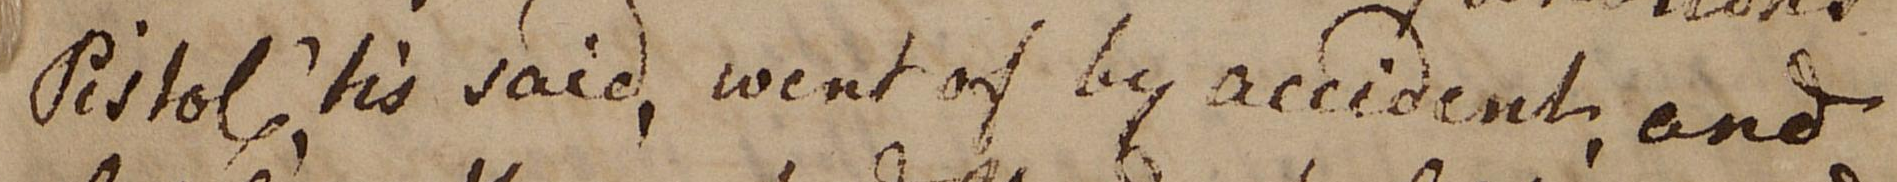Pistol 'tis said, went of by accident, and
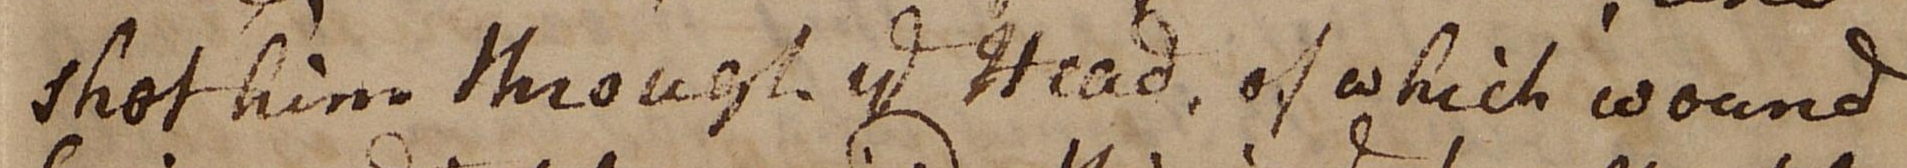shat him through y^e Head, of which wound
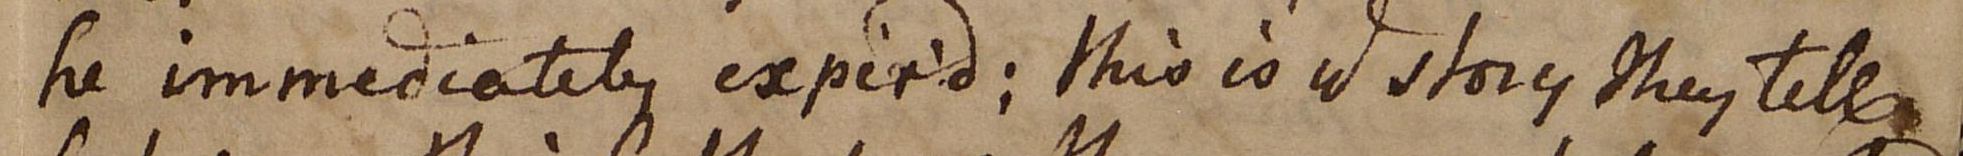he immediately expir'd; this is y^e story they tell
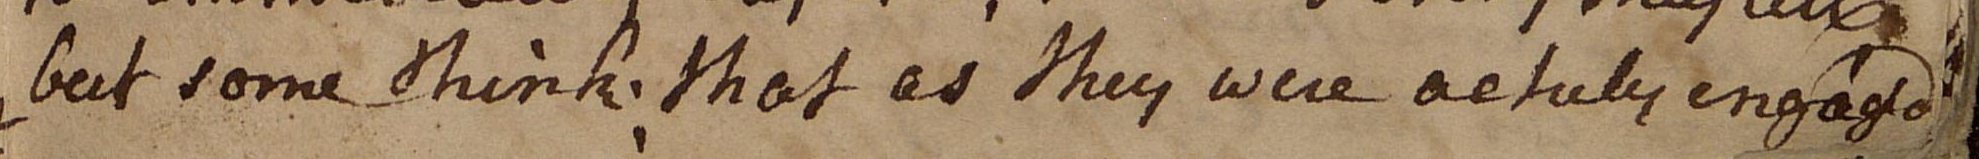but some think; that as they were actuly engag'd
